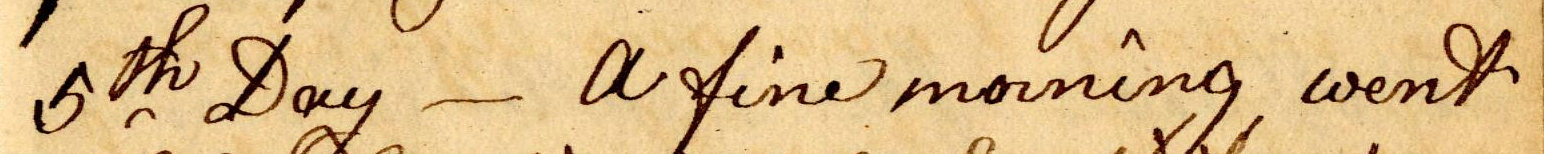5^th Day- A fine morning went
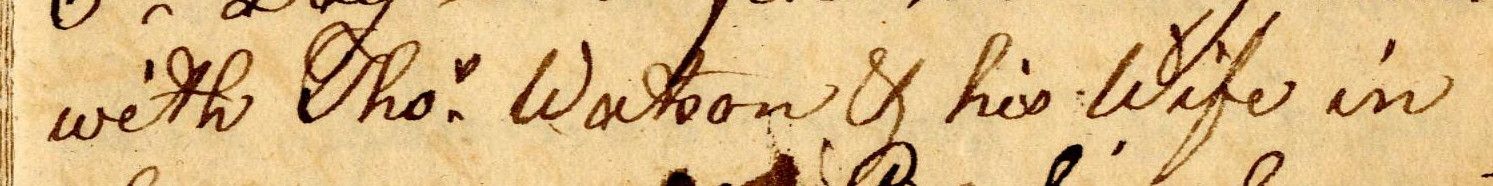with Tho^s. Watson & his Wife in
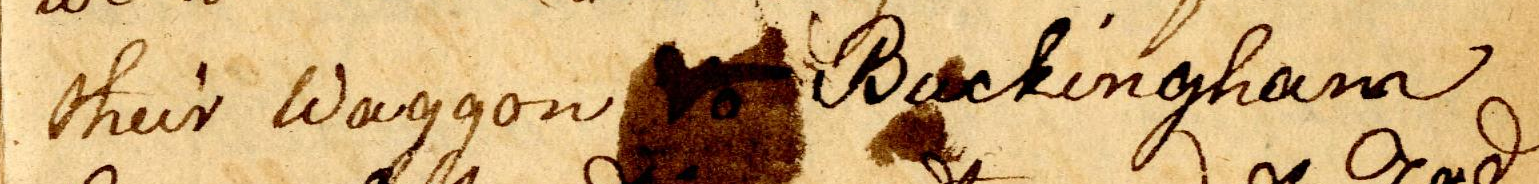their Waggon [_] Buckingham
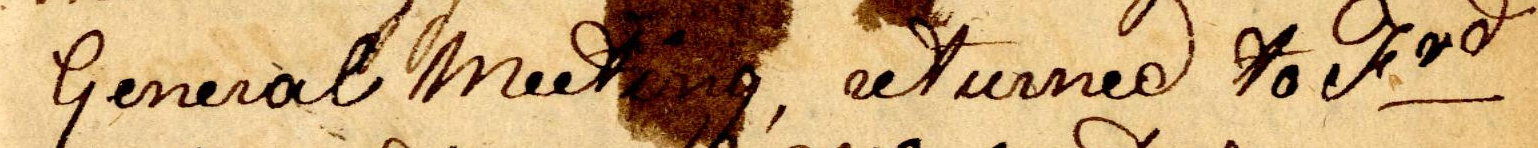General Meet[ing], returned to F^rd
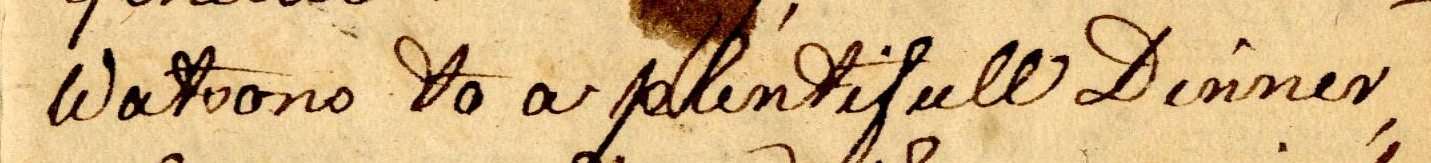Watsons to a plentifull Dinner,
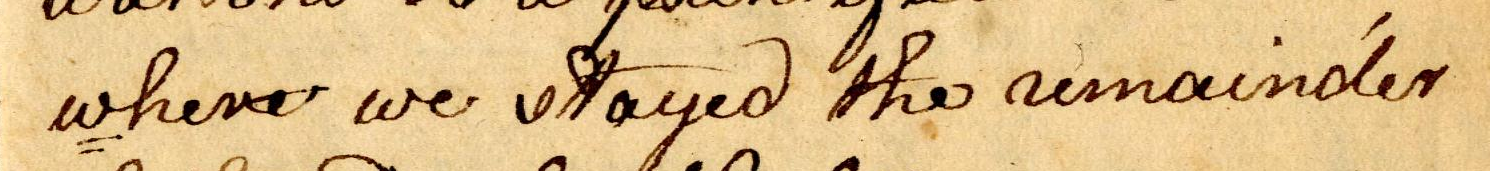where we stayed the remainder
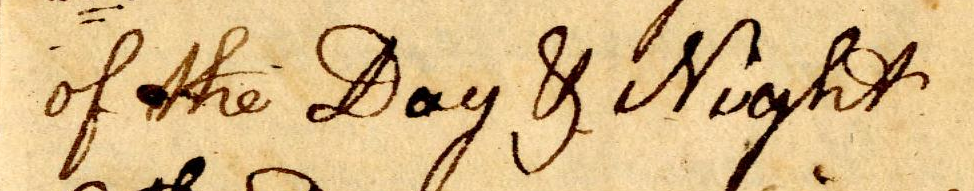of the Day & Night
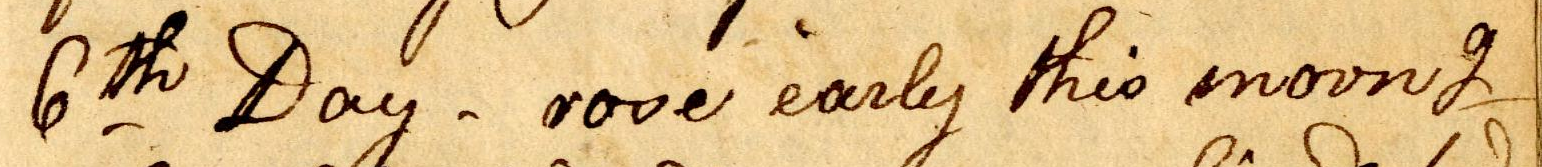6^th Day- rose early this morn^g
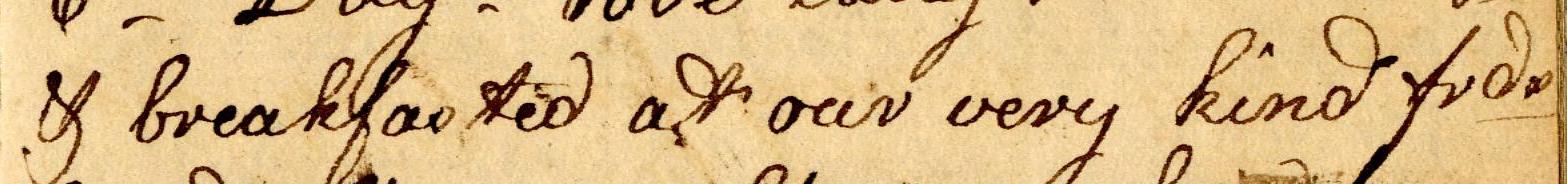& breakfasted at our very kind frds
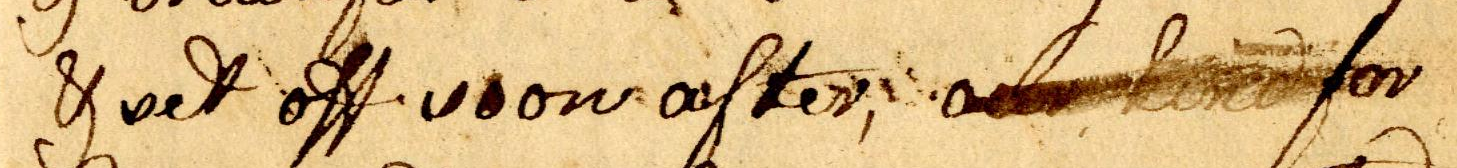& set off soon after [our kind] for
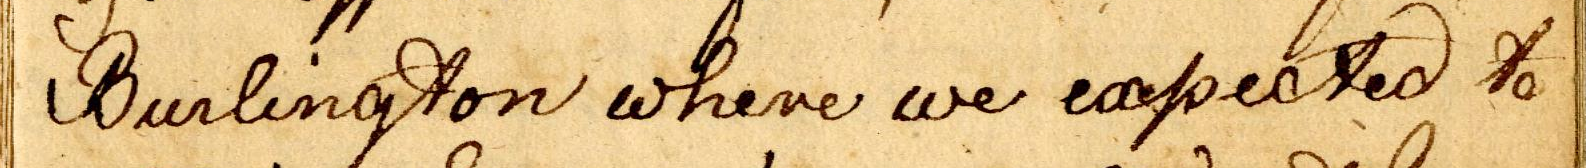Burlington where we expected to
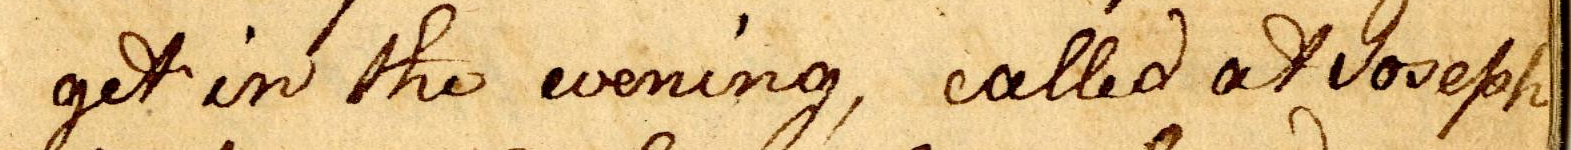get in the evening, called at Joseph
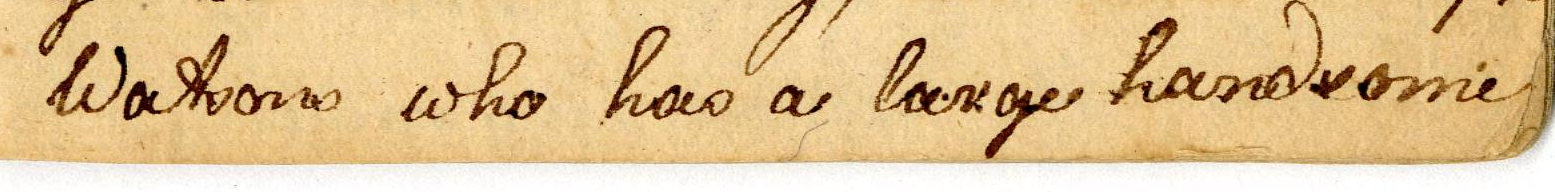Watsons who has a large handsome
